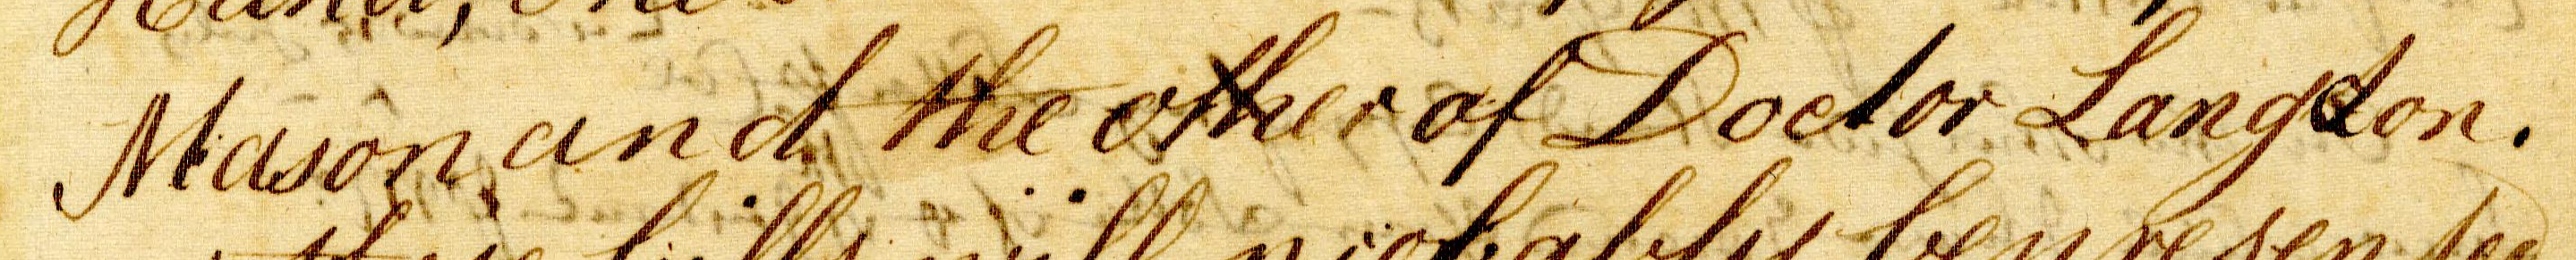Mason and the other of Doctor Langdon.
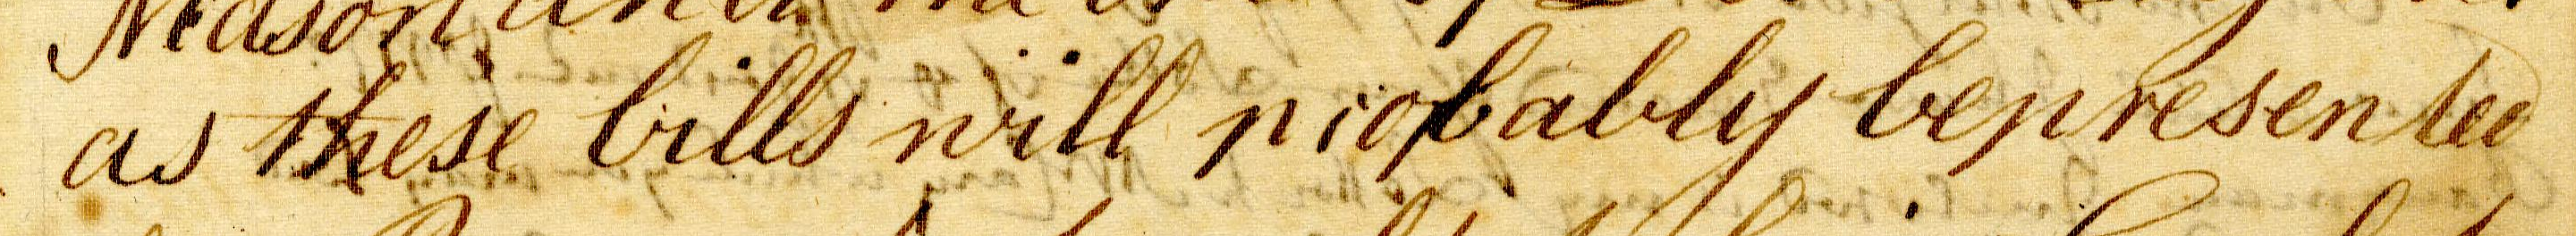as these bills will probably be presented
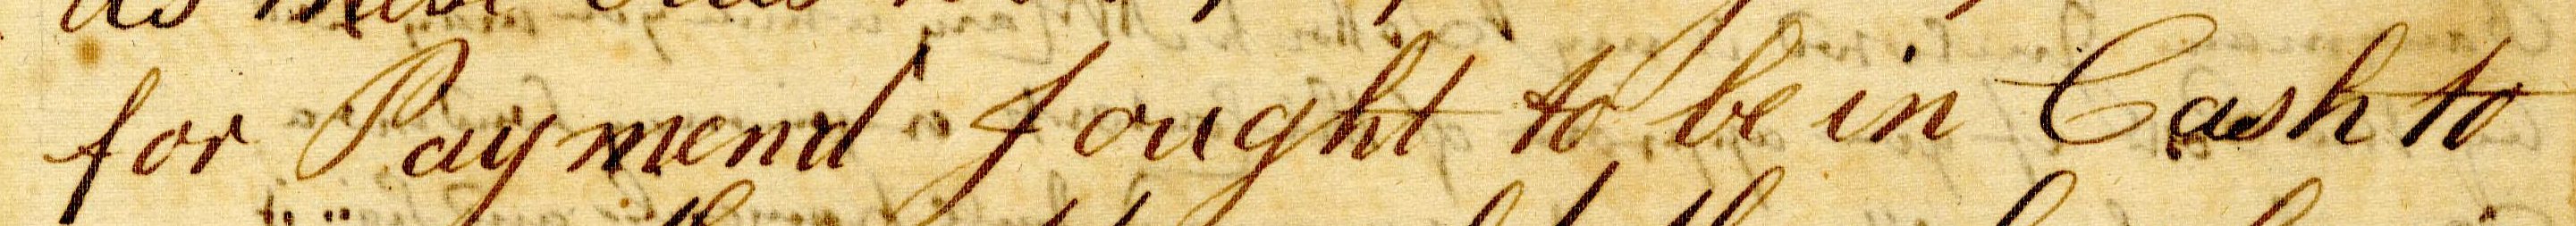for Payment I ought to be in Cash to
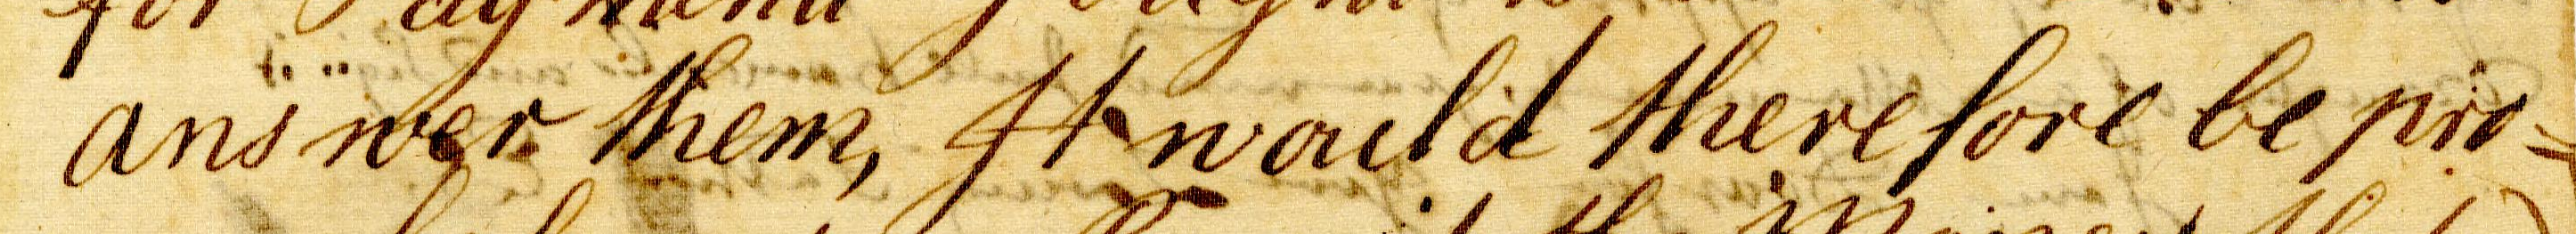Answer them, It would therefore be pro-
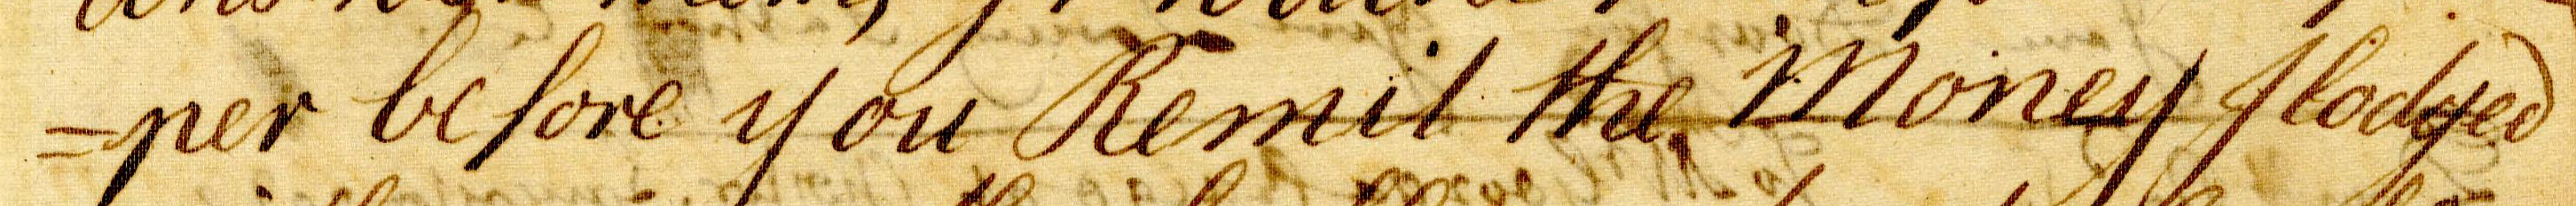-per before You Remit the Money I lodged
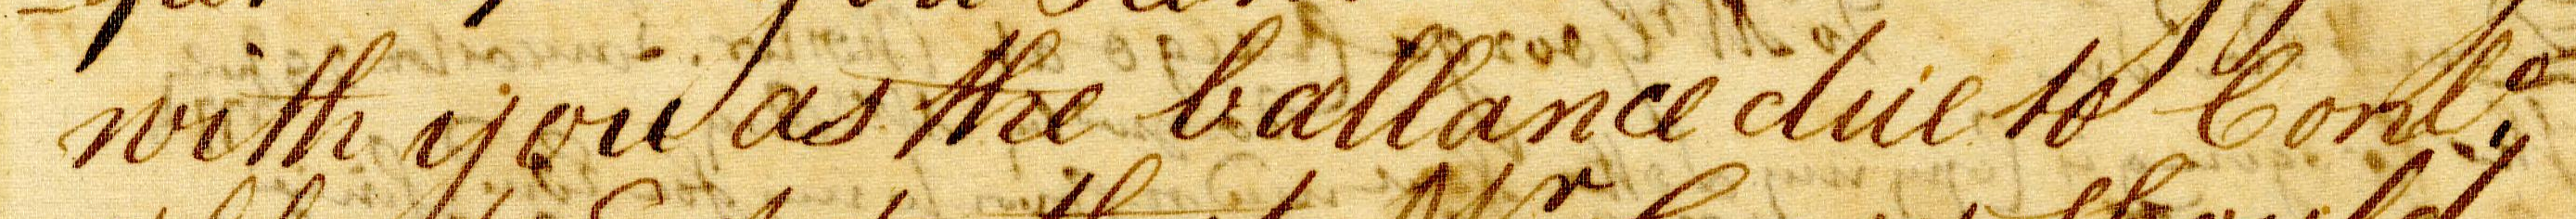with You as the ballance due to Conl^o.
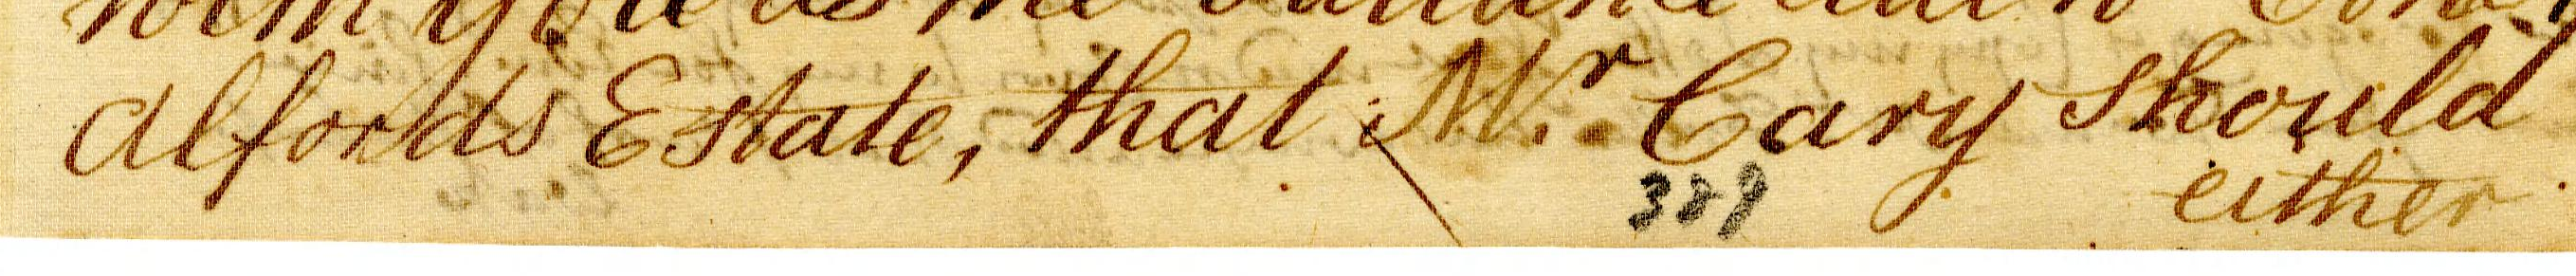Alfords Estate, that M^r. Cary Should
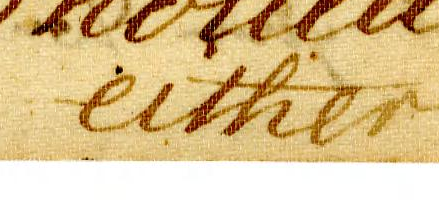either
